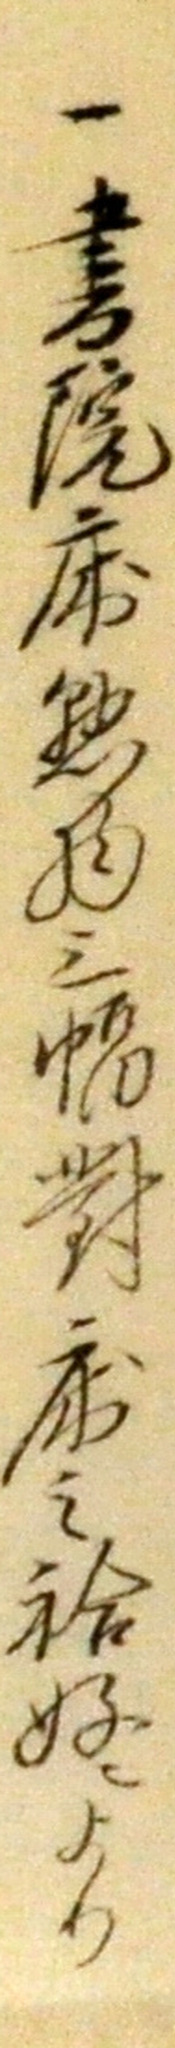一書院床懸物三幅対床之袷好ニより
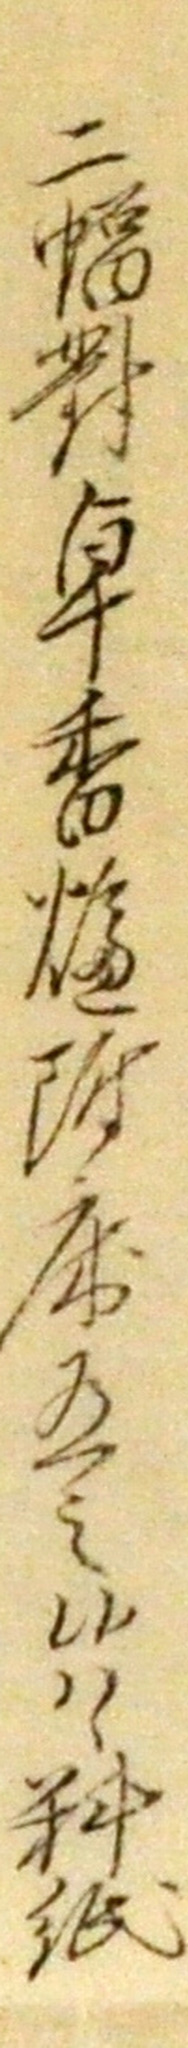二幅対卓香炉附床有之候ハヽ料紙
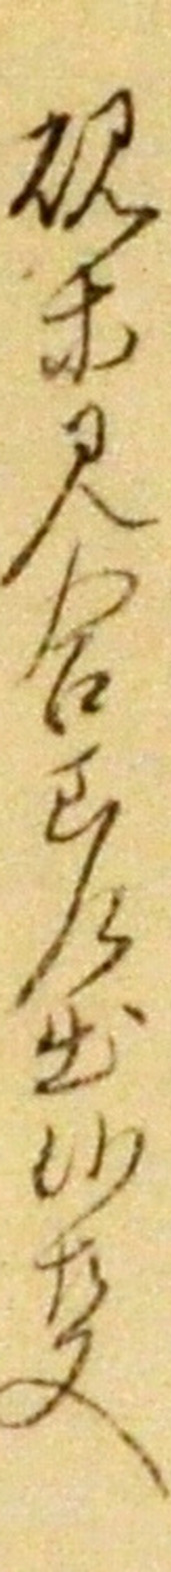硯等見合差出候事
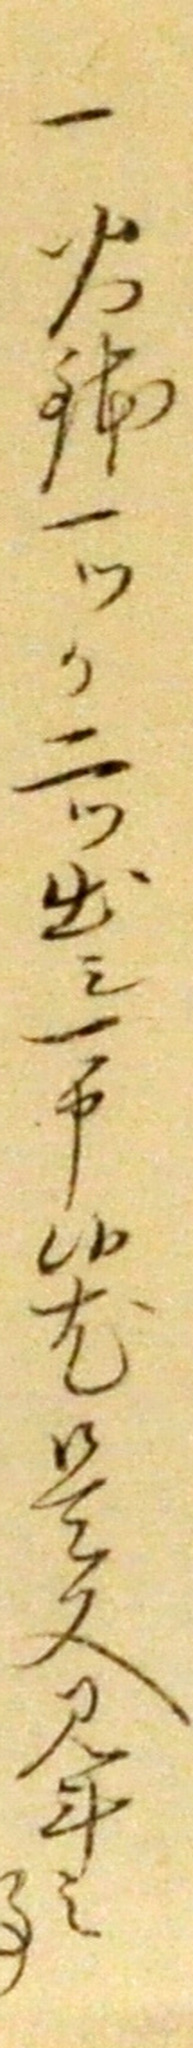一火鉢一ツか二ツ出シ可申候尤是又見計之事
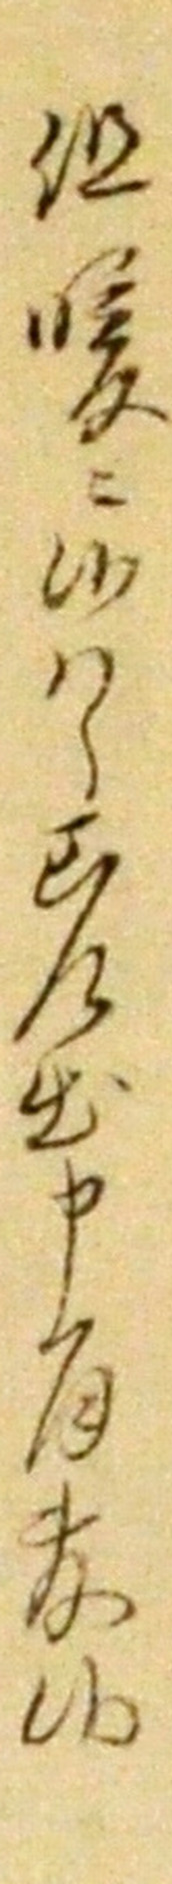但暖二候ハヽ差出申間敷候
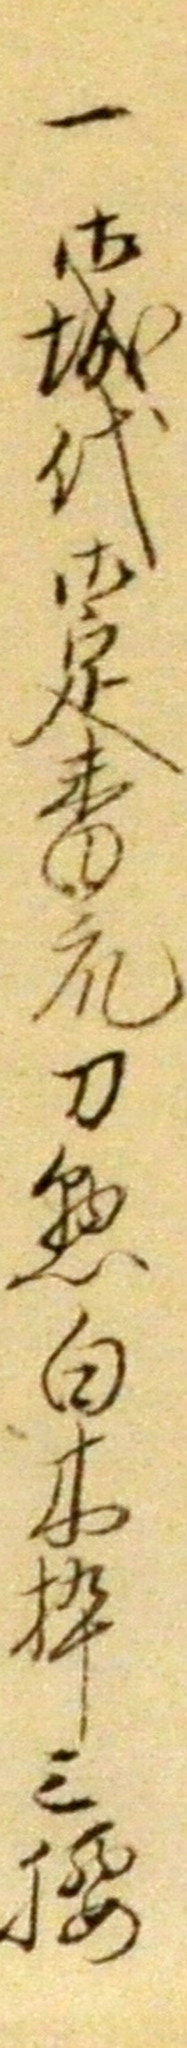一御城代御定番衆刀懸白木枠三腰
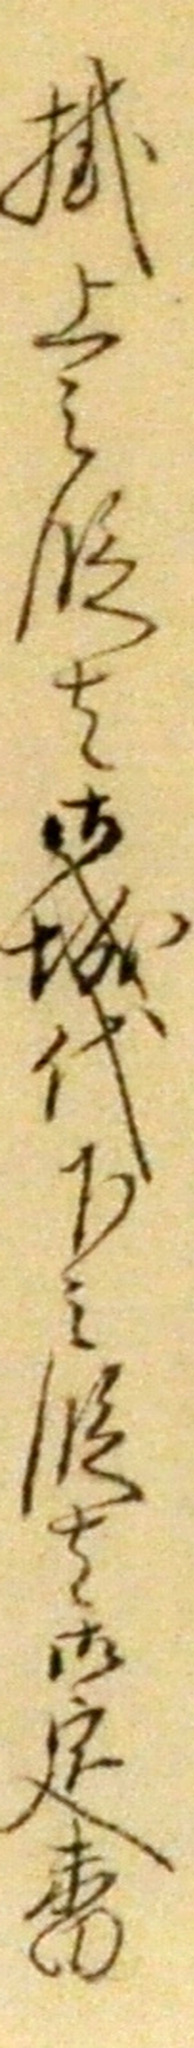掛上之段者御城代下之段者御定番
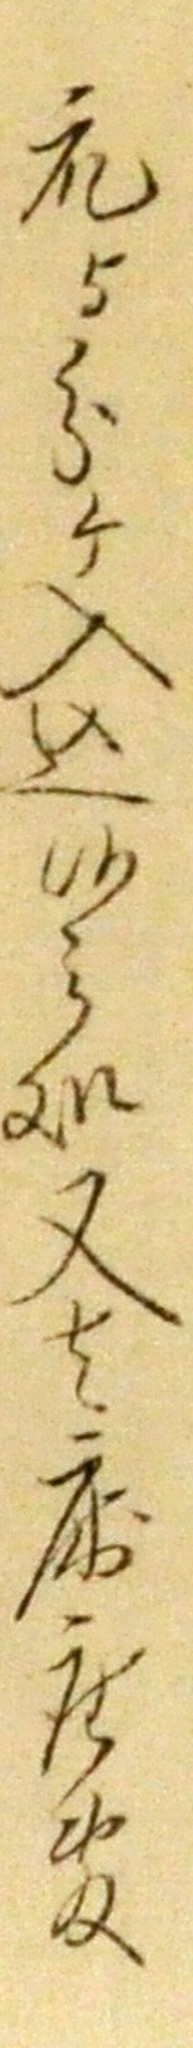衆与分ヶ入込候之処又者床座敷
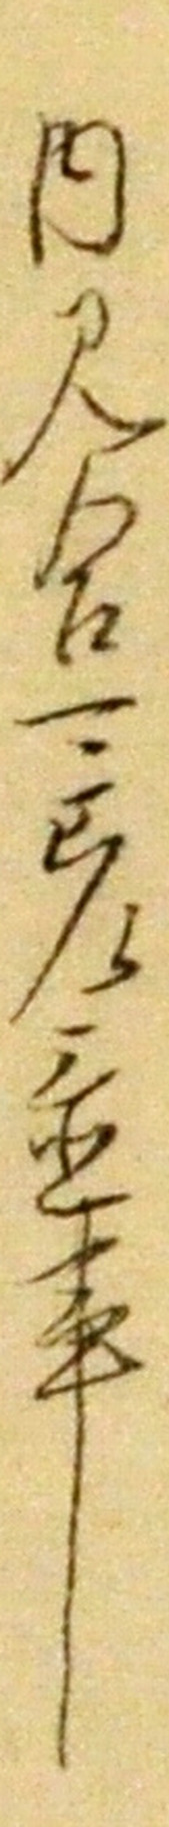内見合可差置事
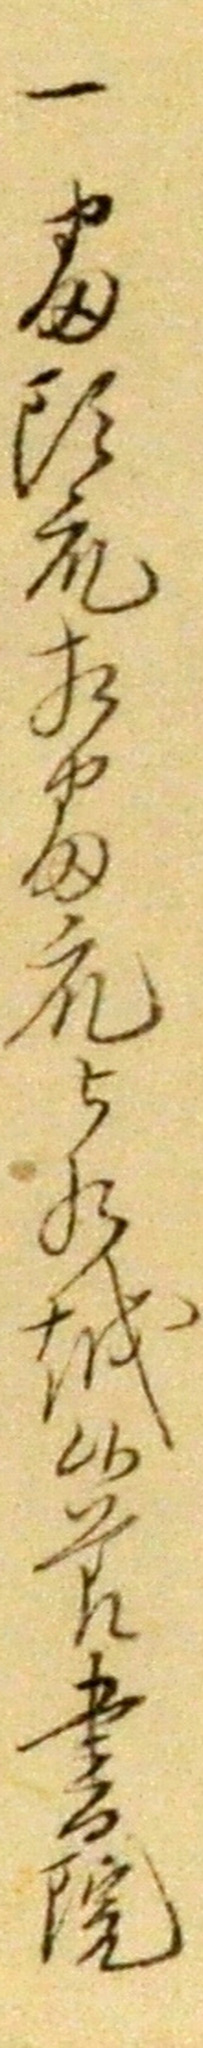一番頭衆相番衆被相越候節書院
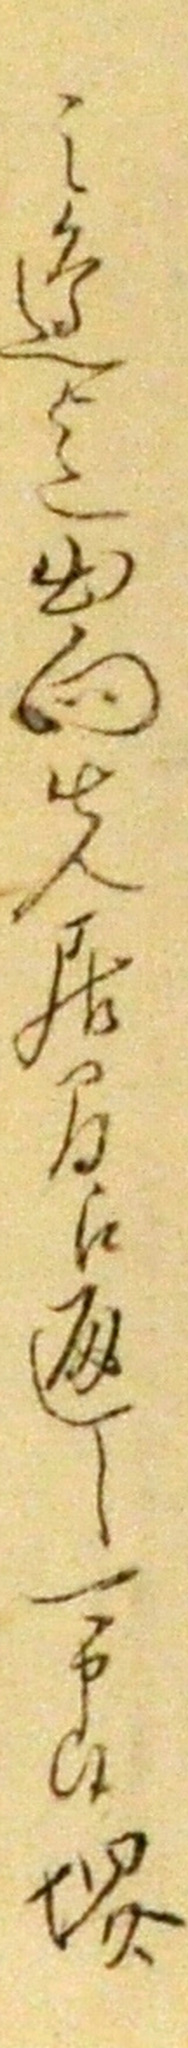之辺迄出向先居間江通し可申候堺
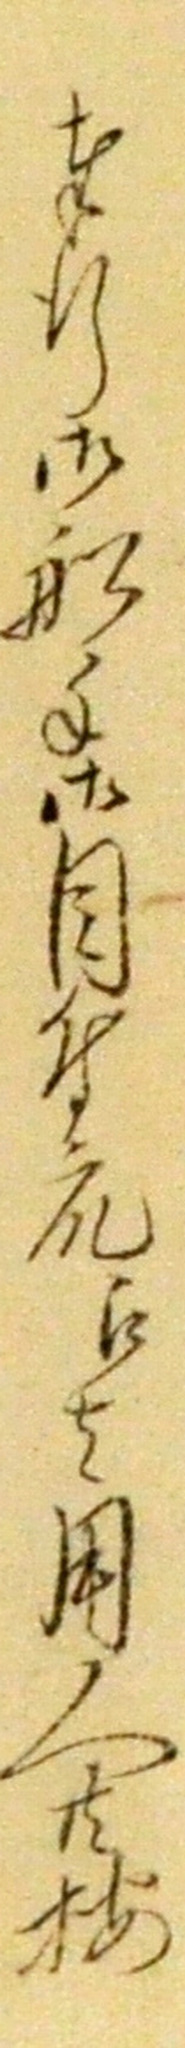奉行御船手御目付衆江者用人共案
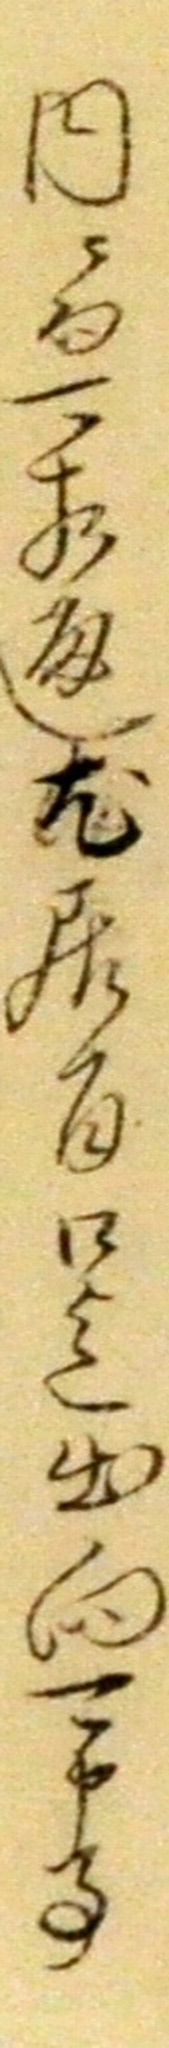内ニ而可相通尤居間口迄出向可申事
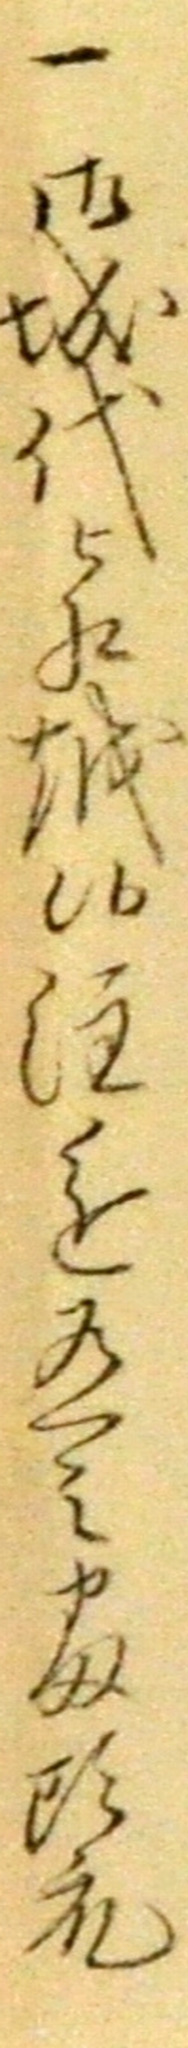一御城代被相越候注進有之番頭衆

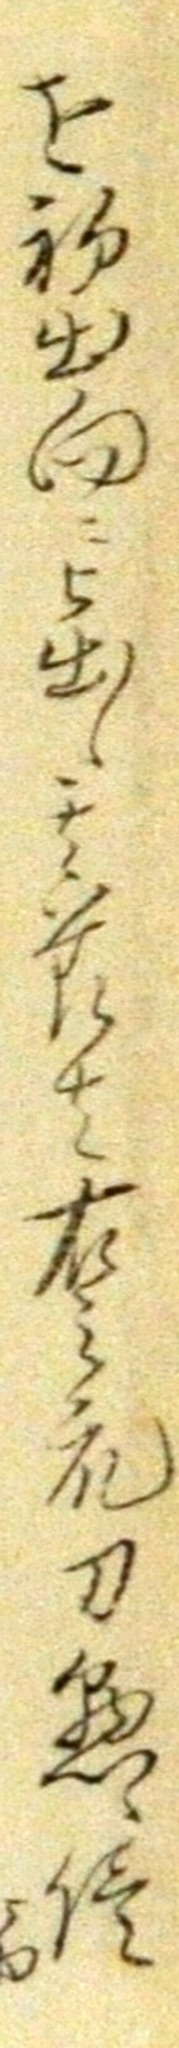を初出向ニ被出候其節者右之衆刀懸候侭二而
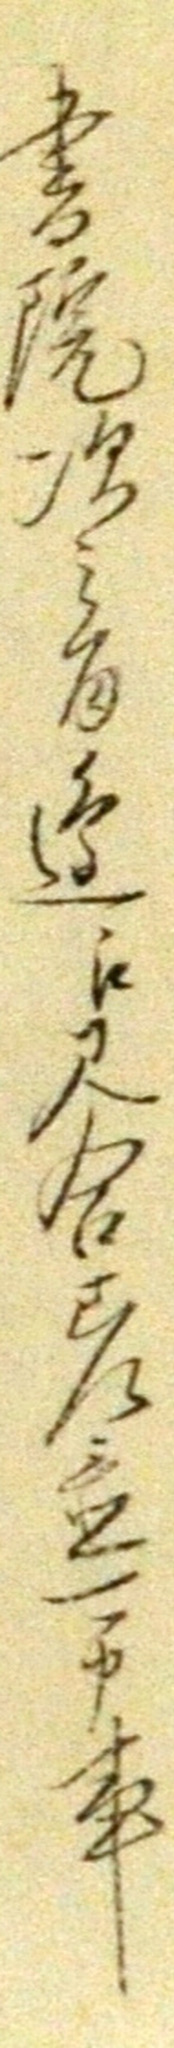書院次之間辺江見合差置可申事
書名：大阪加番関係諸書留〔一括〕
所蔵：伊那市立高遠町図書館・合同会社AMANE
